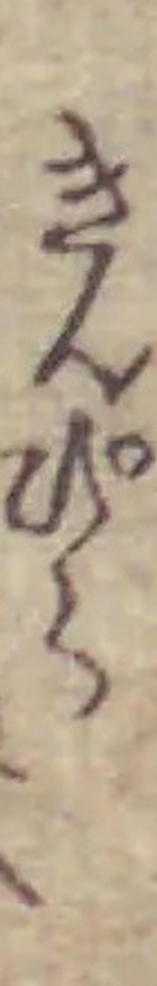きんぴら
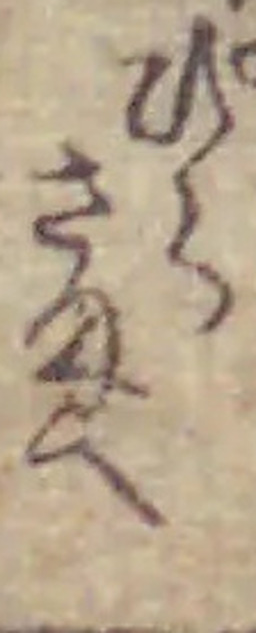さまへ
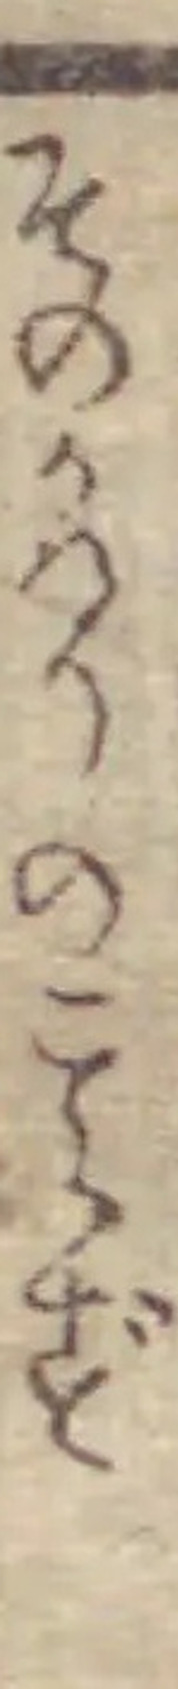そのかはりのこらず
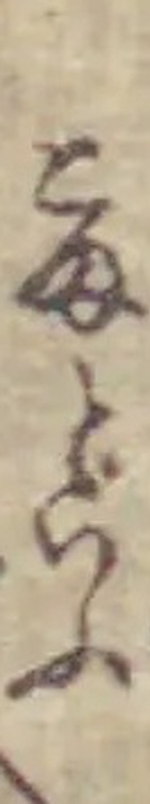こまといふ
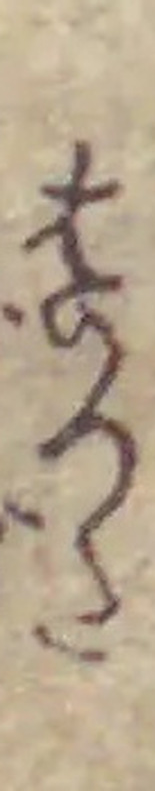はいつた
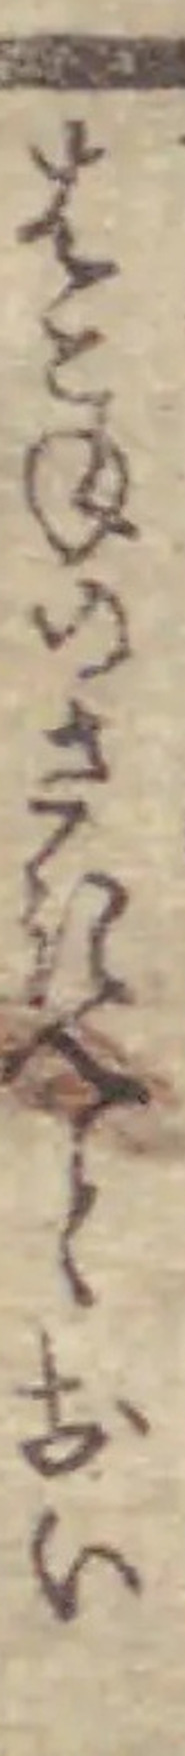はこねのあきへとおい
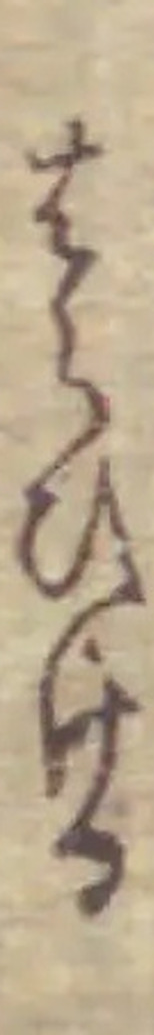はらひける

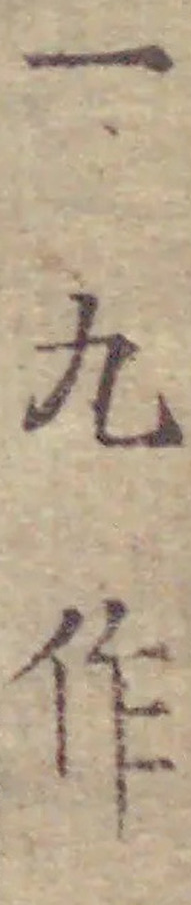一九作
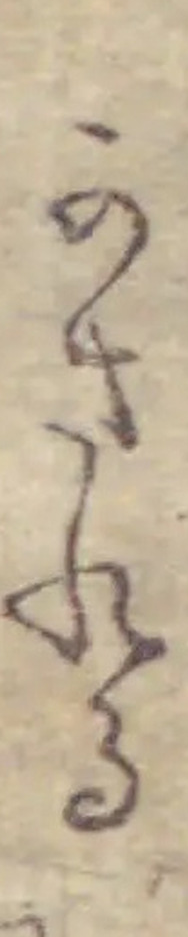かされる
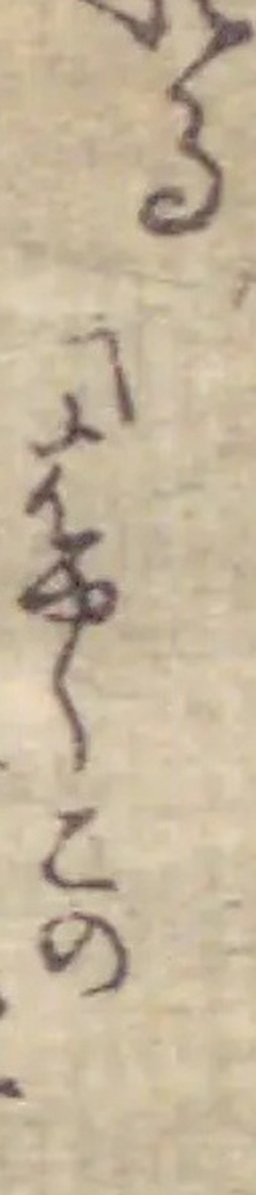〽はやくこの
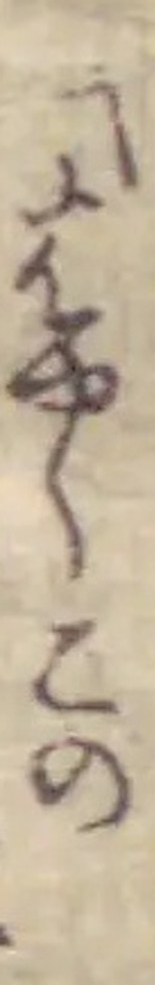〽はやくこの
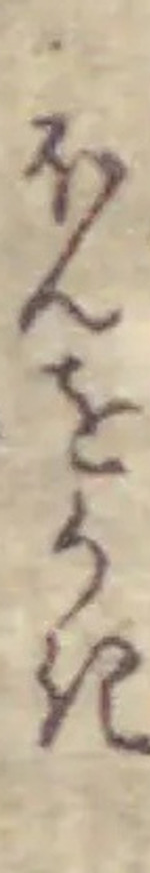ほんをかき
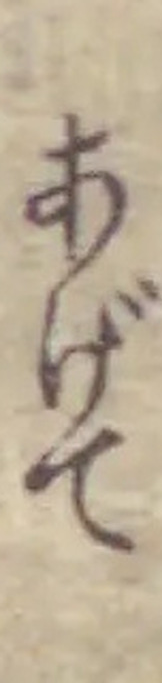あげて
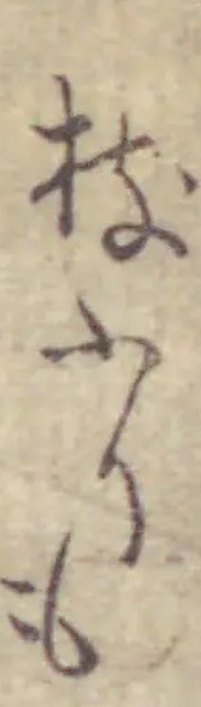枝ふりも
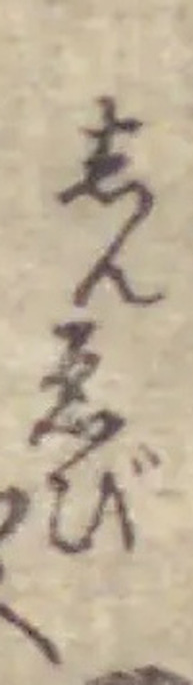しんゑび
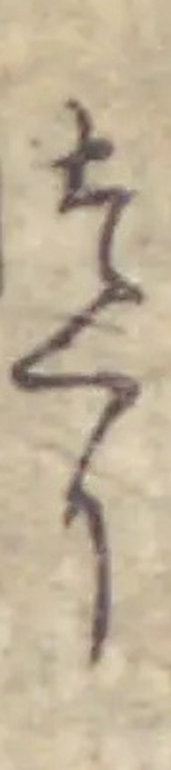つくり
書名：化物敵討 2巻
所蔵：国立国会図書館 National Diet Library, JAPAN
